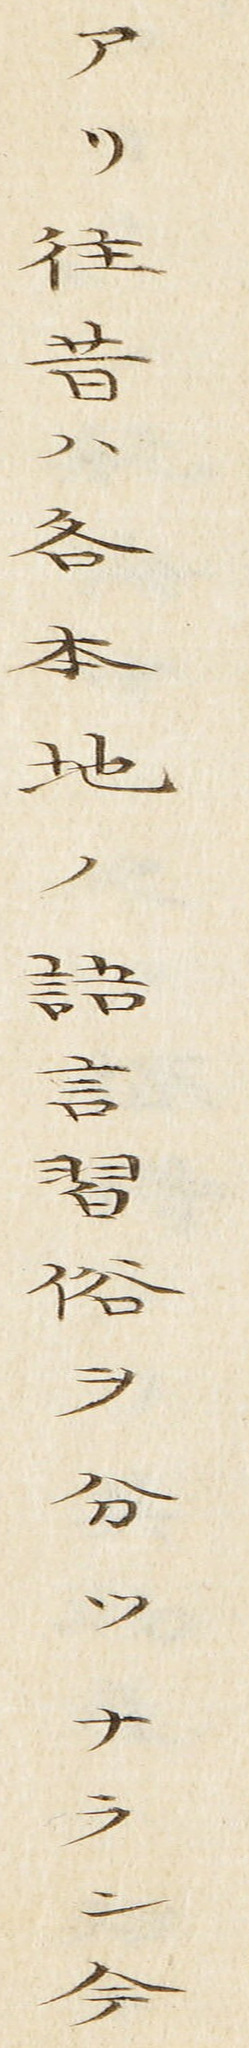アリ往昔ハ各本地ノ語言習俗ヲ分ツナラン今
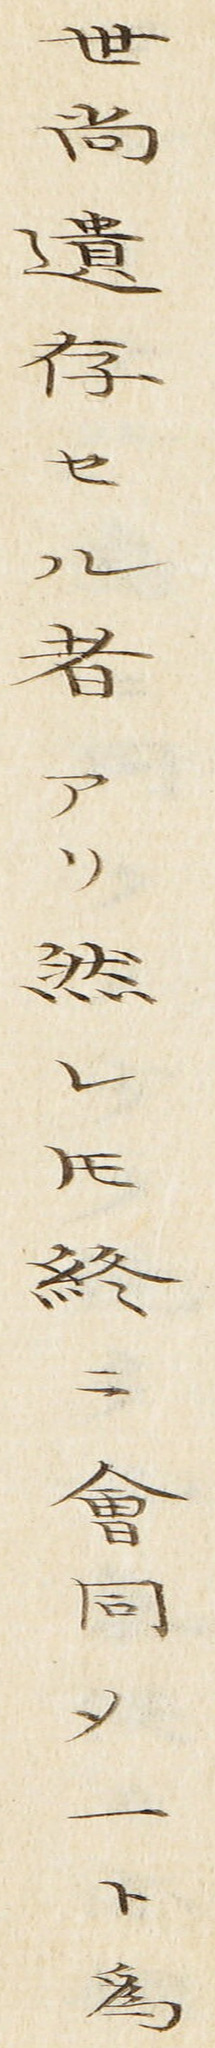世尚遺存セル者アリ然レトモ終ニ會同シテ一ト為
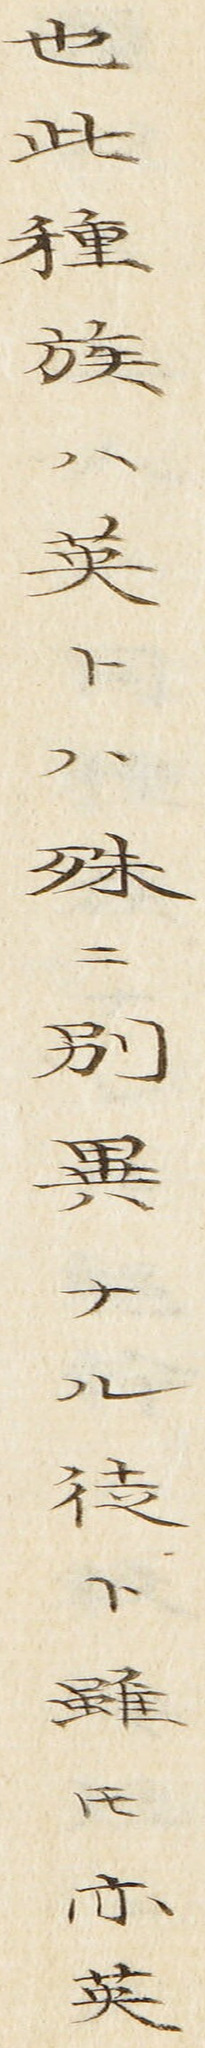也此種族ハ英トハ殊ニ別異ナル徒ト雖トモ亦英
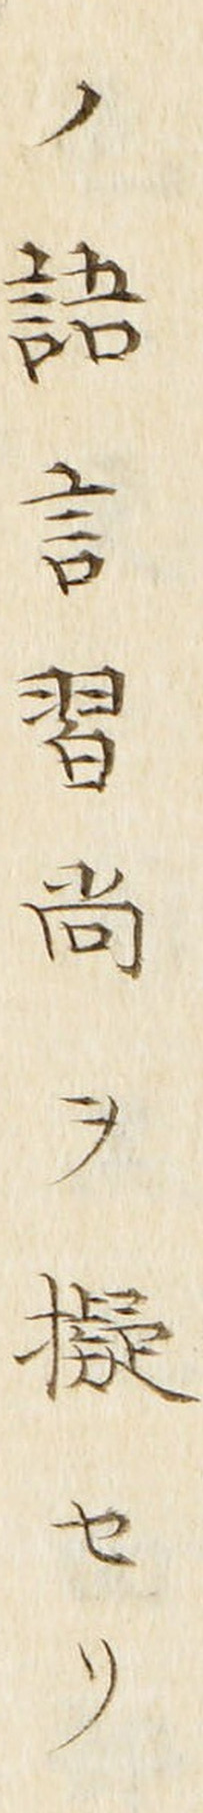ノ語言習尚ヲ擬セリ

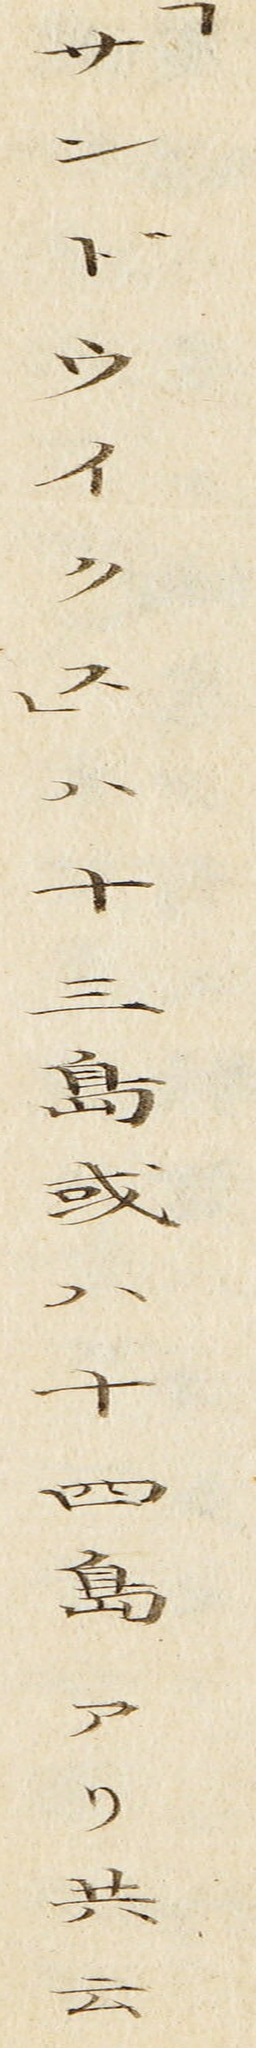「サンドウイクス」ハ十三島或ハ十四島アリ共云
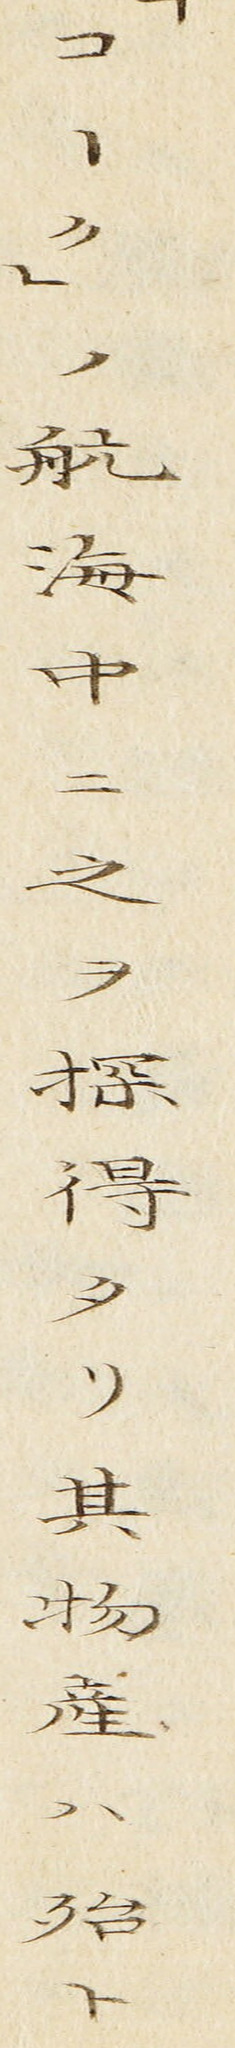「コーク」ノ航海中ニ之ヲ探得タリ其物産ハ殆ト
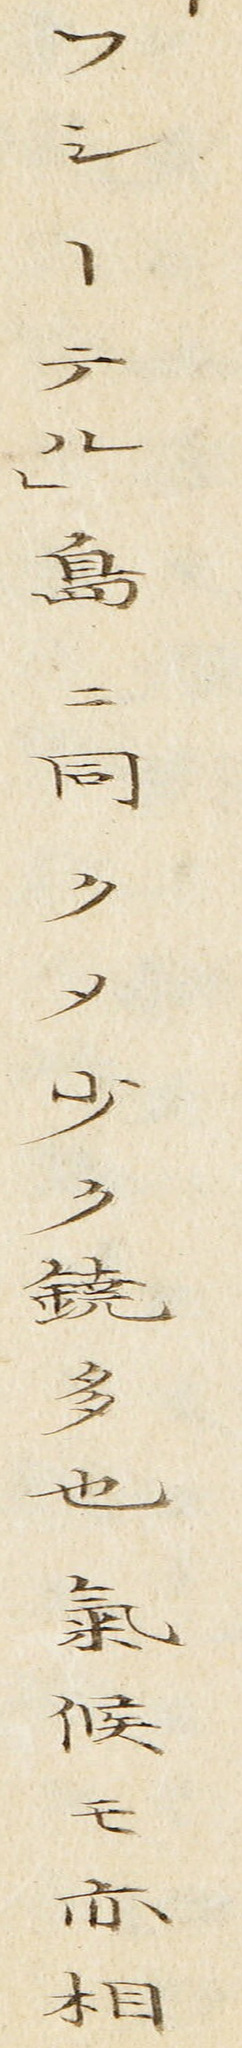「フシーテル」島ニ同クシテ少ク鐃多也氣候モ亦相
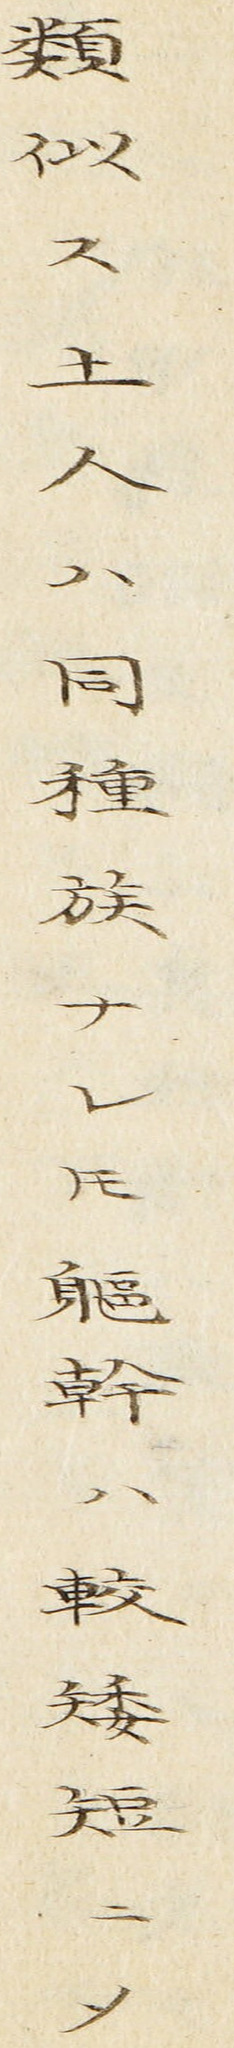類似ス土人ハ同種族ナレトモ軀幹ハ較矮短
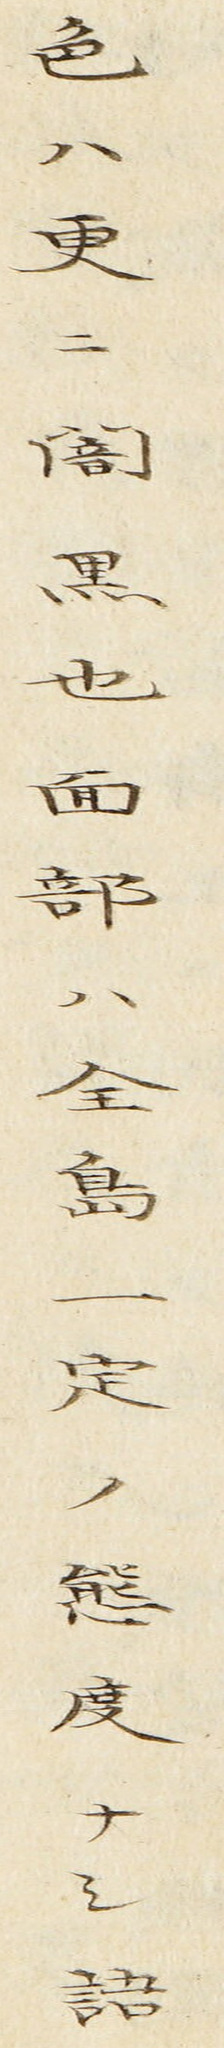色ハ更ニ闇黒也面部ハ全島一定ノ態度ナシ語
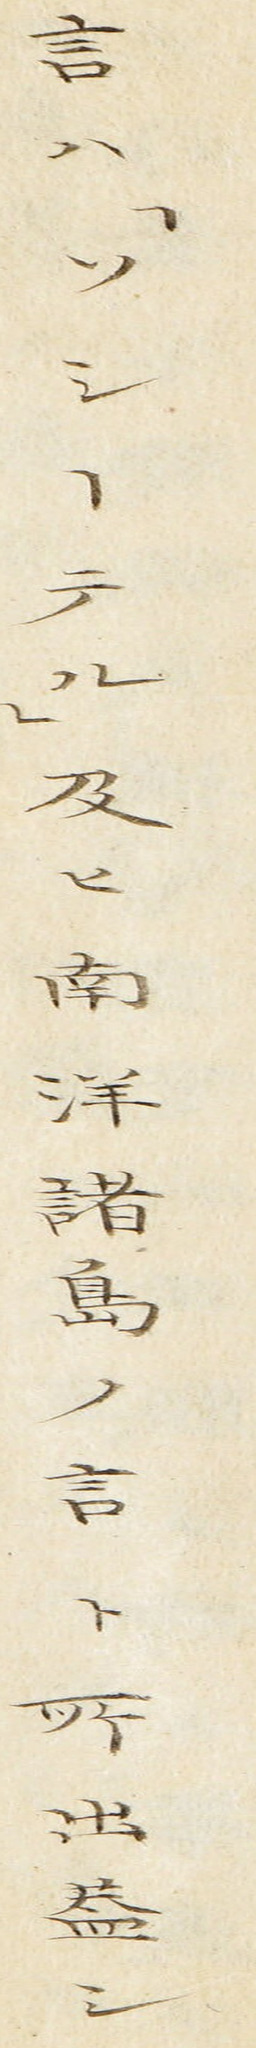言ハ「ソシーテル」及ヒ南洋諸島ノ言ト所出蓋シ
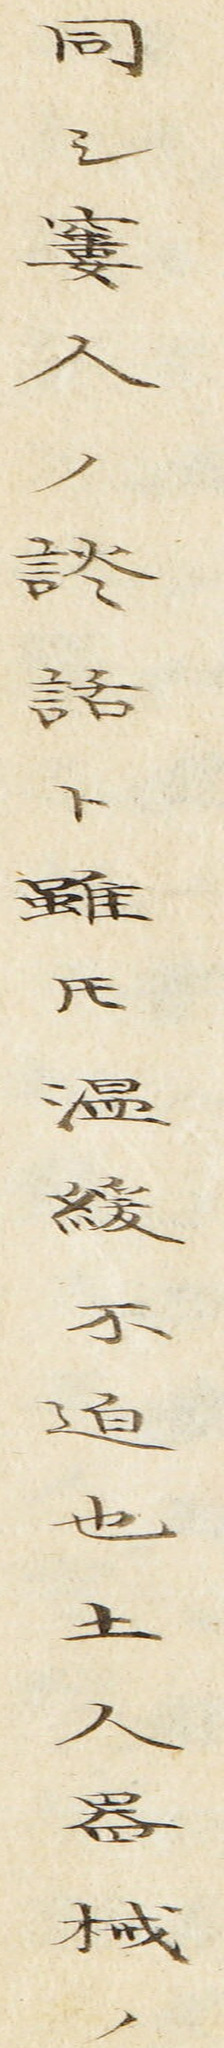同シ屡人ノ談話ト雖トモ温緩不迫土人器械ノ
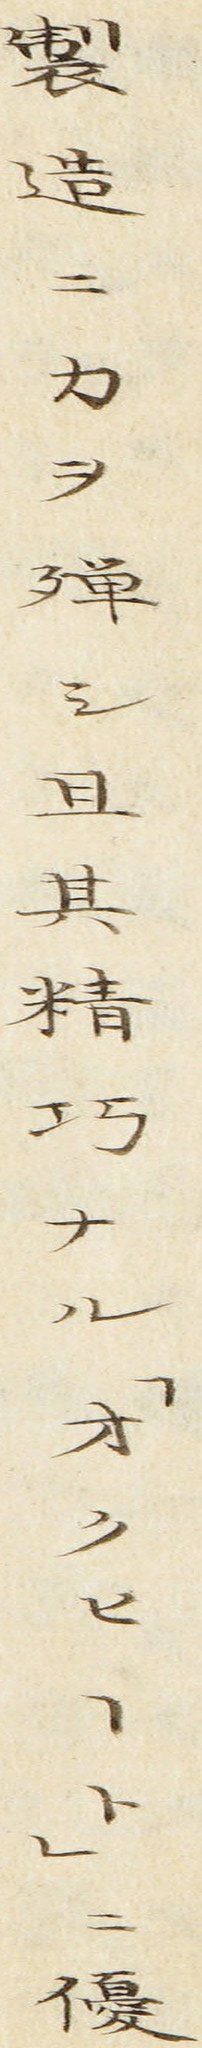製造ニ力ヲ殫シ且其精巧ナル「オクヒート」ニ優
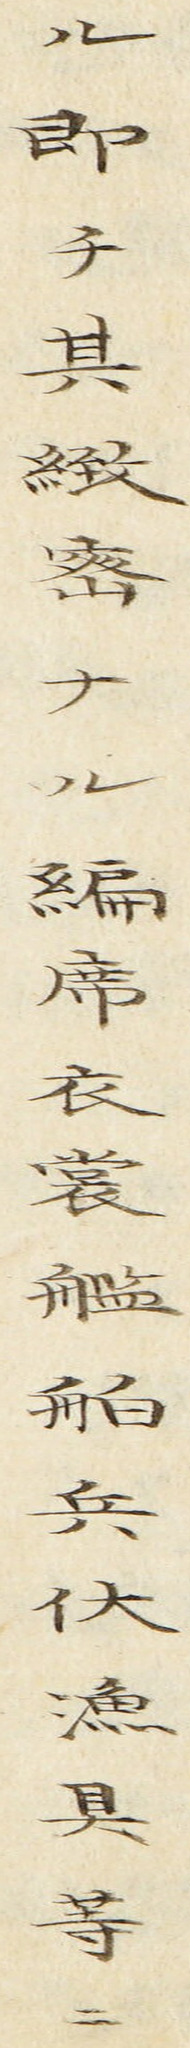ル即チ其緻密ナル編席衣裳艦舶兵伏漁具等ニ

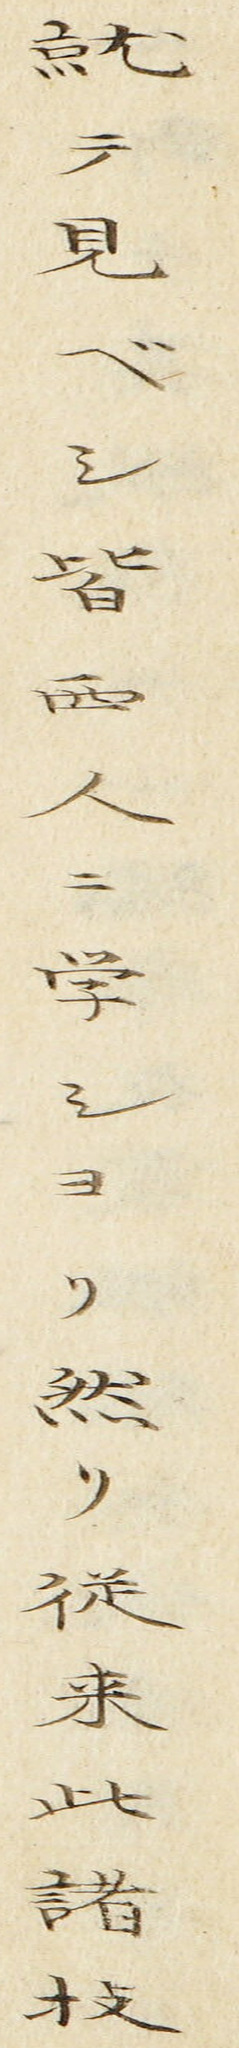就テ見ベシ皆西人ニ学シヨリ然リ従来此諸技
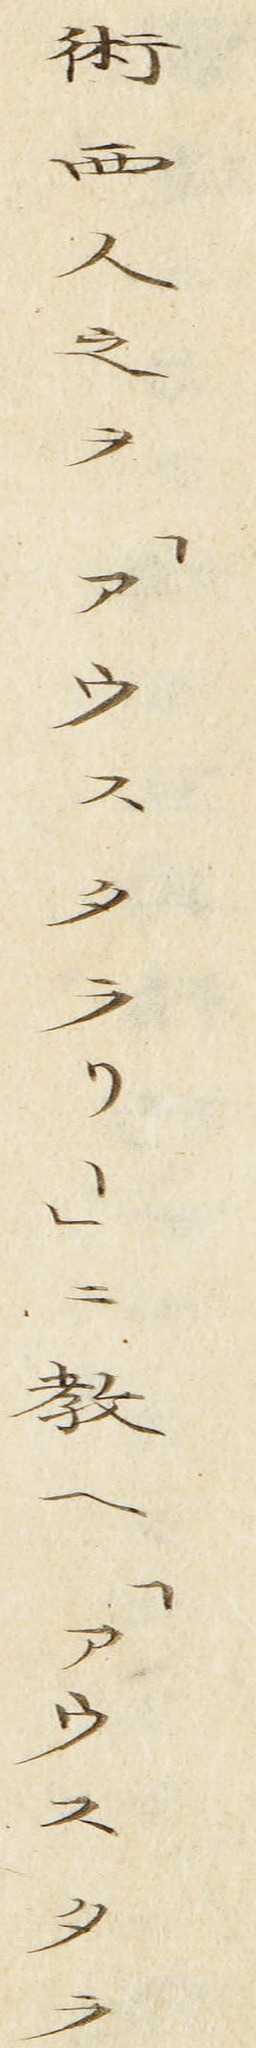術西人之ヲ「アウスタラリー」ニ教ヘ「アウスタラ
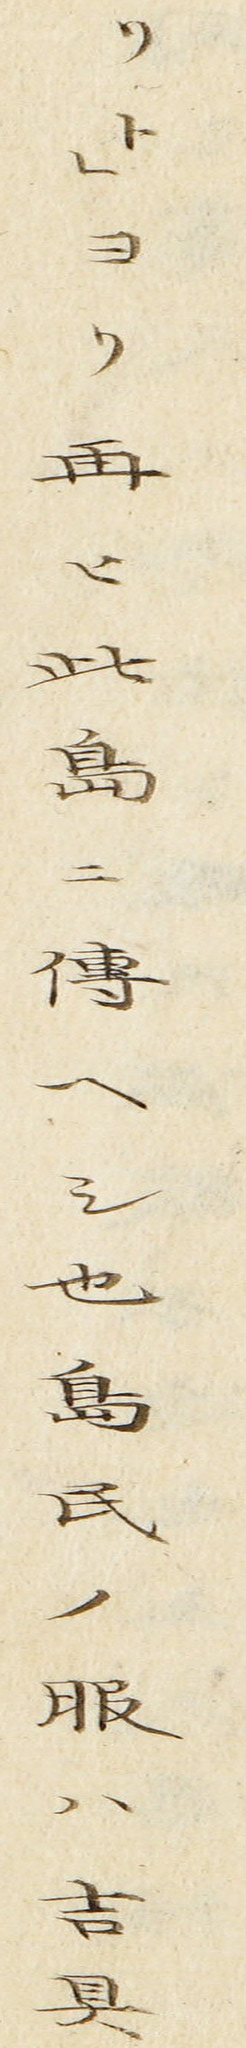リト」ヨリ再ヒ此島ニ傳ヘシ也島民服賑ハ吉具？
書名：蕃談
